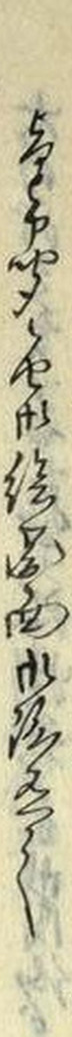旨被申聞候由御絵図面御渡有之
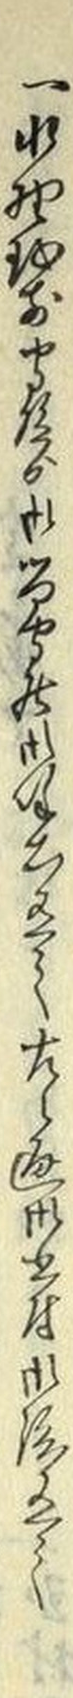一水野越前守殿ゟ御留守居御呼出有之左之通御書付御渡有之
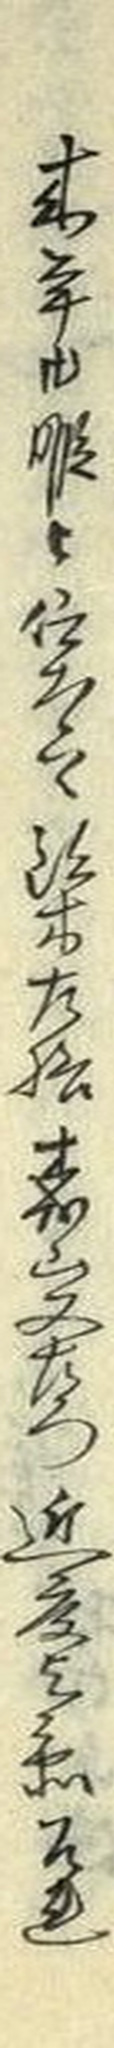来年御暇被仰出候ハヽ鈴木左膳森山又左衛門近藤与兵衛召連
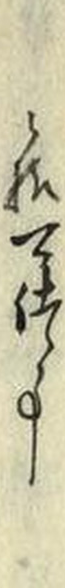候様可仕候事
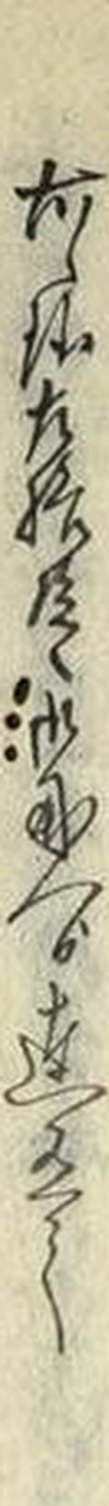右之趣左膳殿へ御用人ゟ達有之
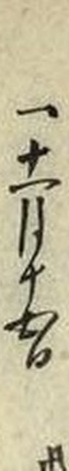一十一月十五日

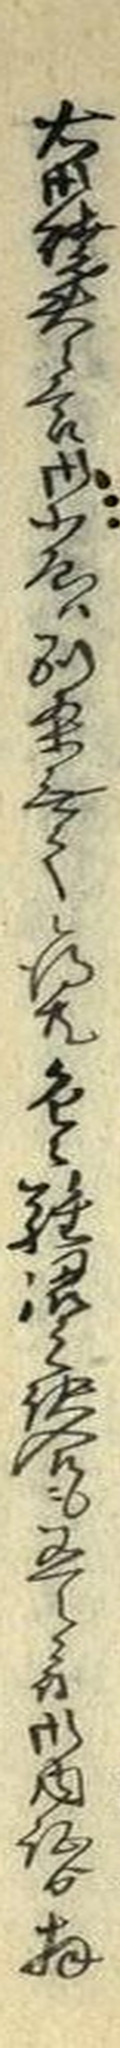右御焼失之節御小屋ハ別条無之候得共色々難渋之訳合も有之ニ付御内証ゟ拝
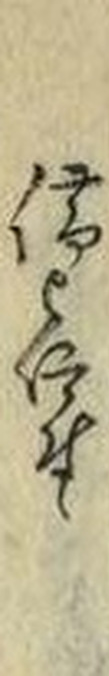借被仰付候
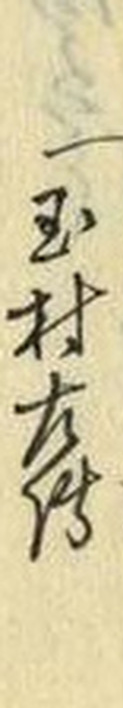玉村左伝
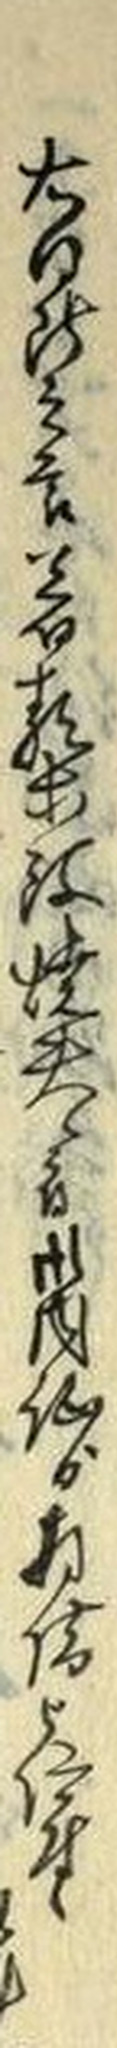右同断之節着類等致焼失候ニ付御内証ゟ拝借被仰付候
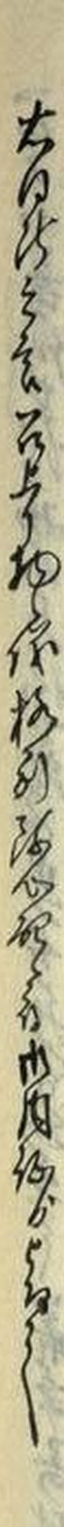右同断之節召上り物之儀格別致心配候ニ付御内証ゟ被下之
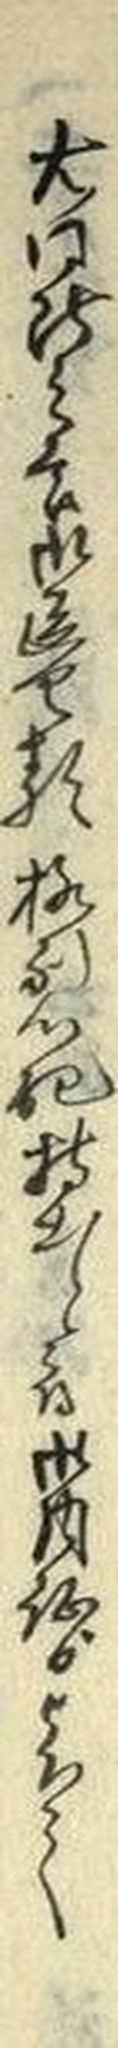右同断之節御道具類格別心配持出し候ニ付御内証ゟ被下之
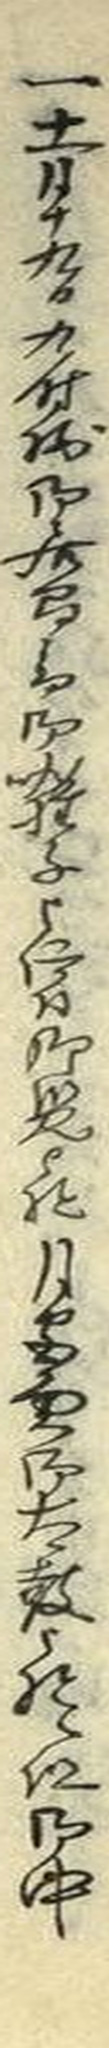一十一月十九日九時揃御居間ニ而御囃子被仰付御覧被遊月宮殿御太鼓被遊候但御中
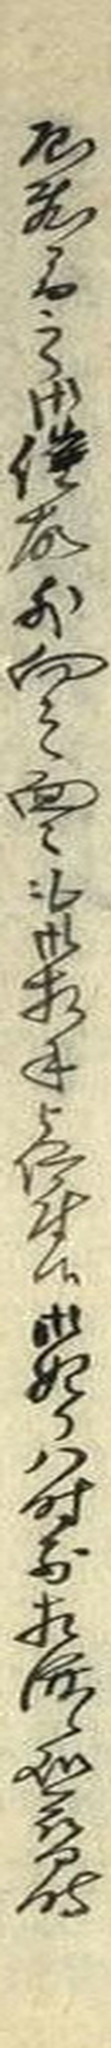屋敷ニ而之御催故外向之面々も御相手被仰付候御始り八時前相済候処暮時
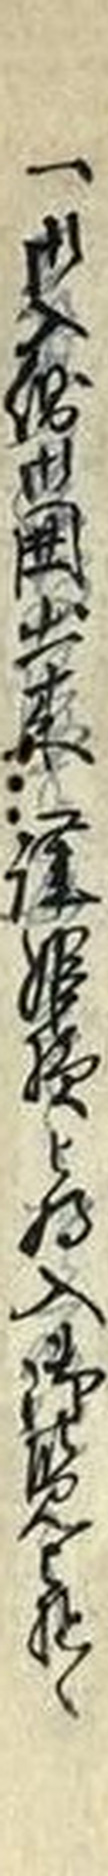一御入側御囲出来謹姫様被為入御覧被遊候
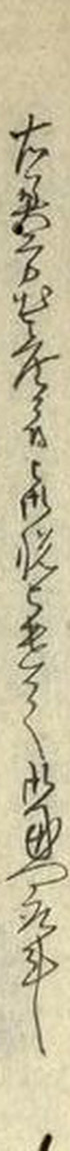右奥方出産ニ付被御悦被遣之御用人取計
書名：少傅日録抄（斉善付側向頭取日記、在府）
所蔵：福井県文書館 Fukui Prefectural Archives
